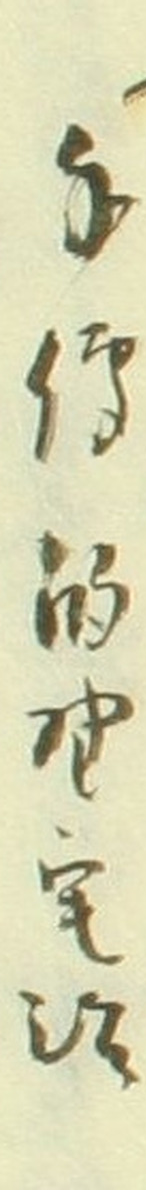手伝的野宅治
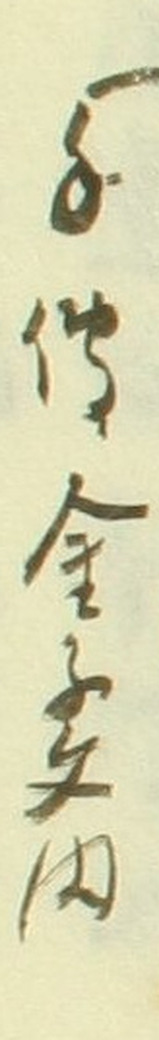手伝金子文内
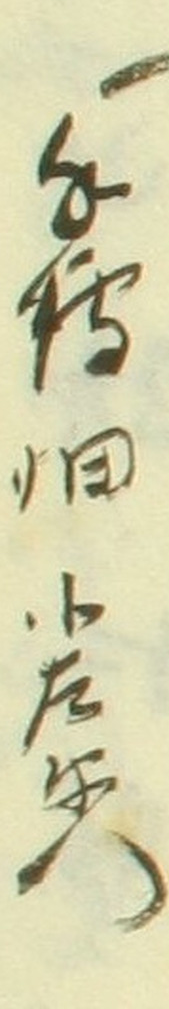手伝畑小左衛門

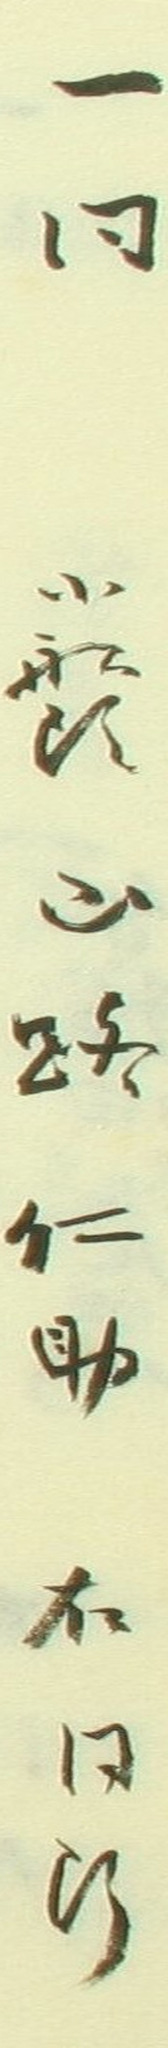一同小船頭山路仁助右同断
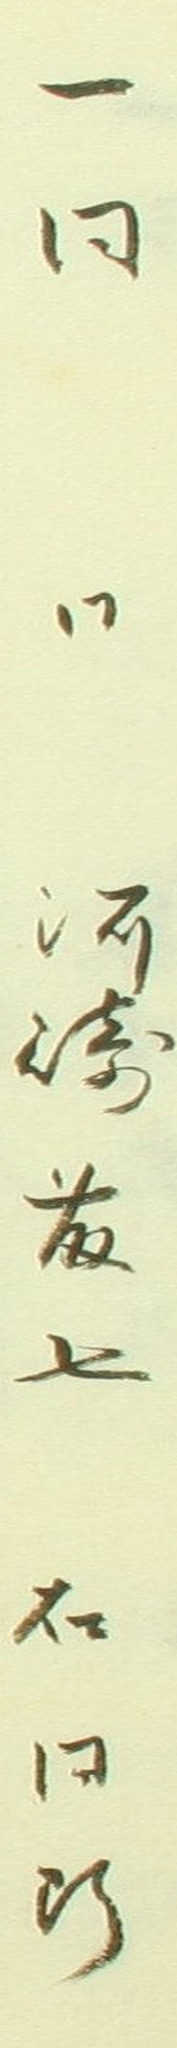一同同河崎藤七右同断
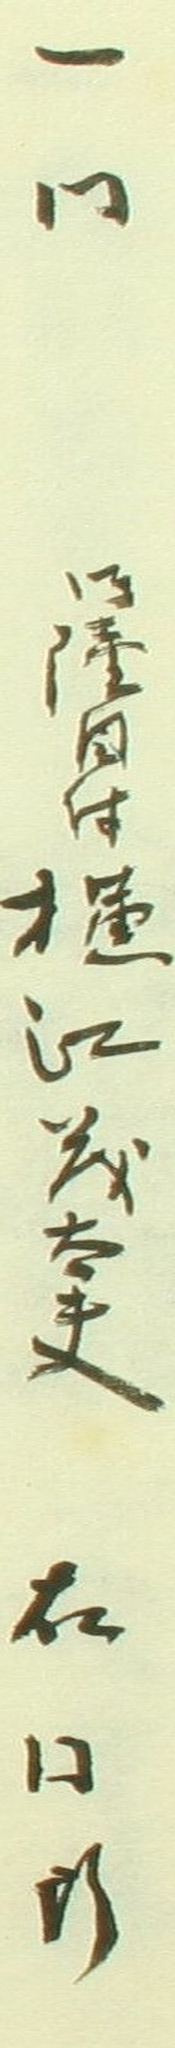一同御陸目付横江茂太夫右同断
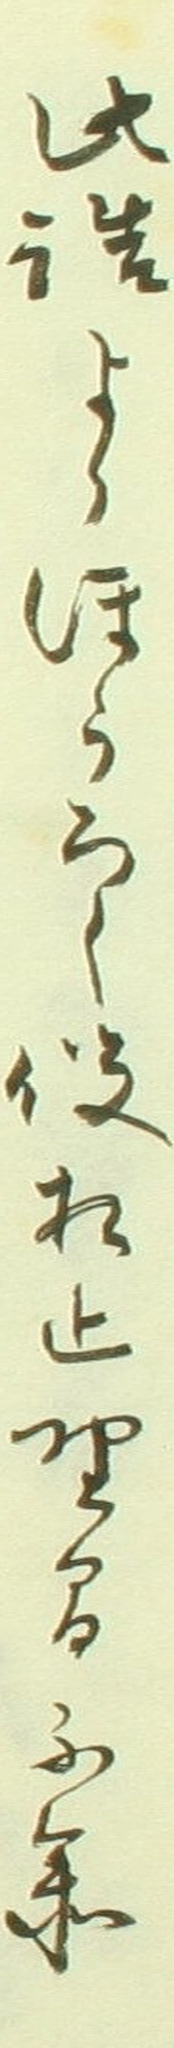此詰よりほうろく役相止野間不参
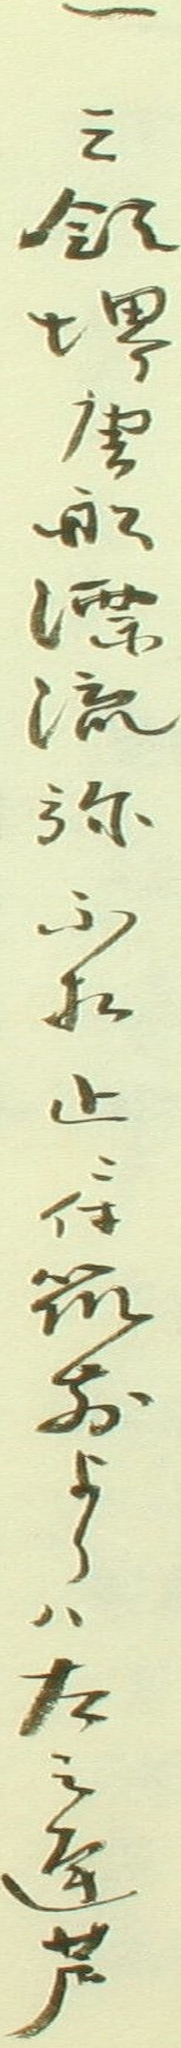一之領塊加唐船漂流弥相止に付筑前よりは左之通芦
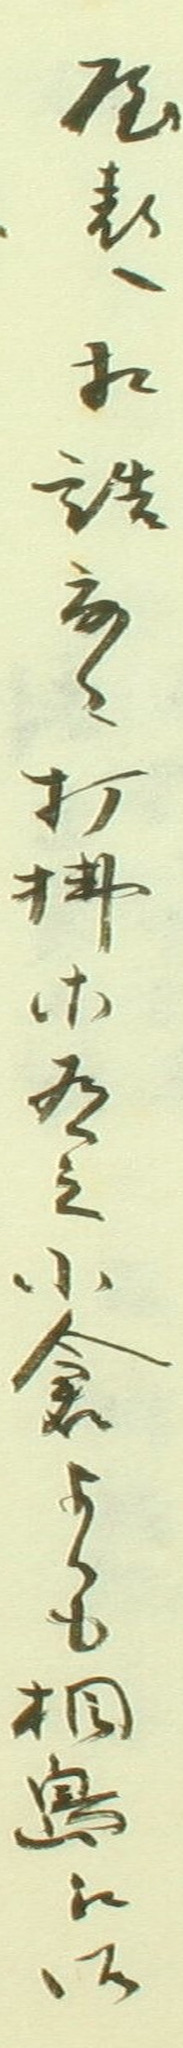屋表へ相詰度々打払等有之小倉よりも相島江御
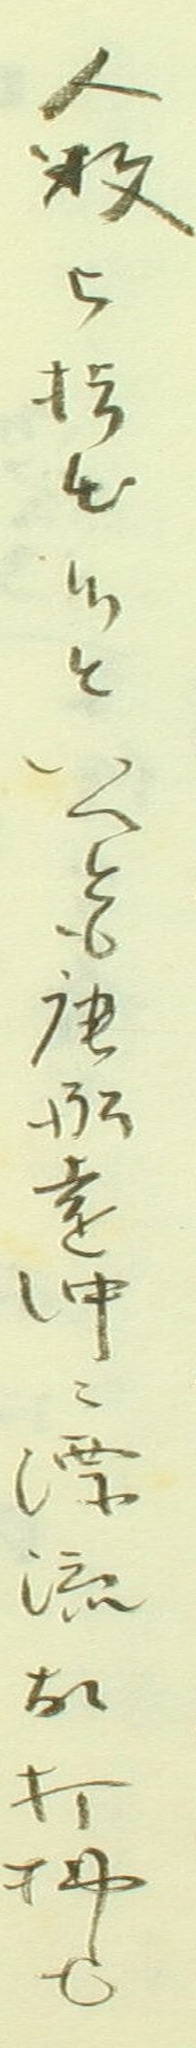人数被指出候といへとも唐船遠沖に漂流故打払も
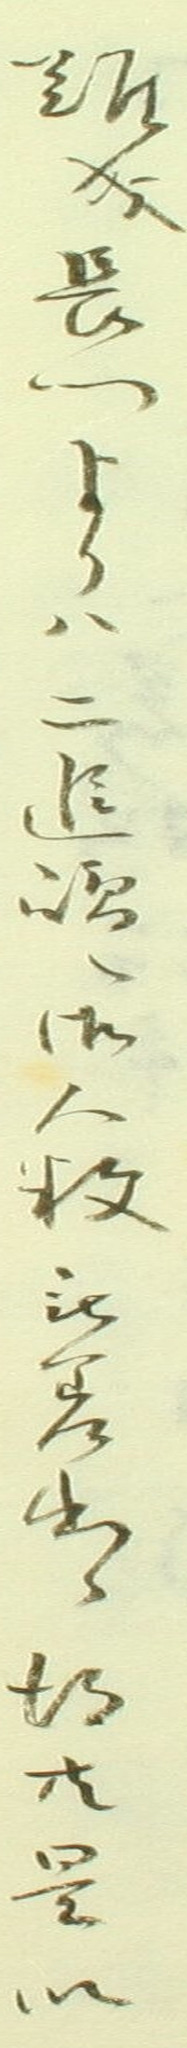難成る長つよりは二追嶋へ御人数被差出候得共是以
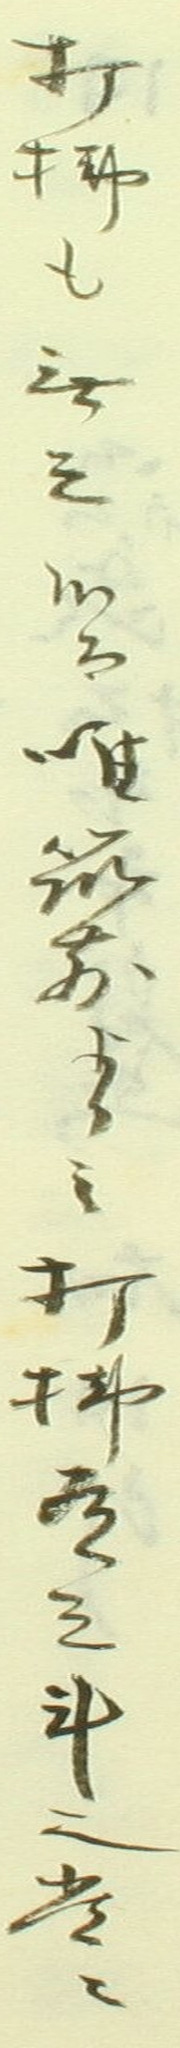打払も無之候而唯筑前より之打払有之斗也道々
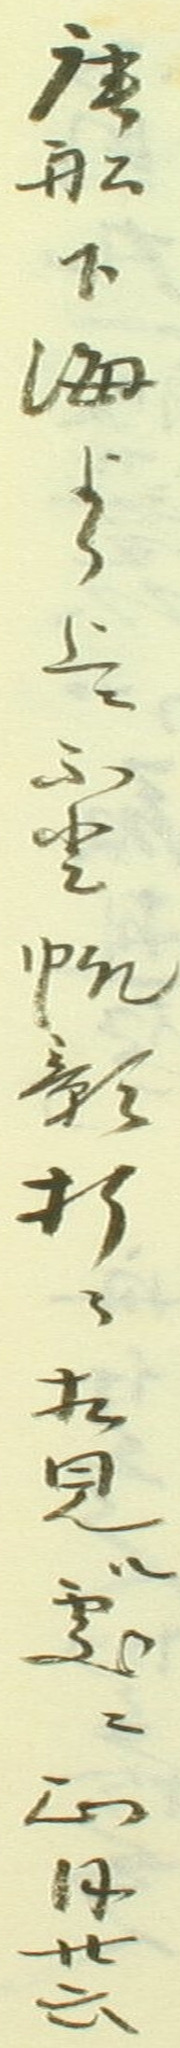唐船下海より上に不登帆類折に相見る處に正月廿六
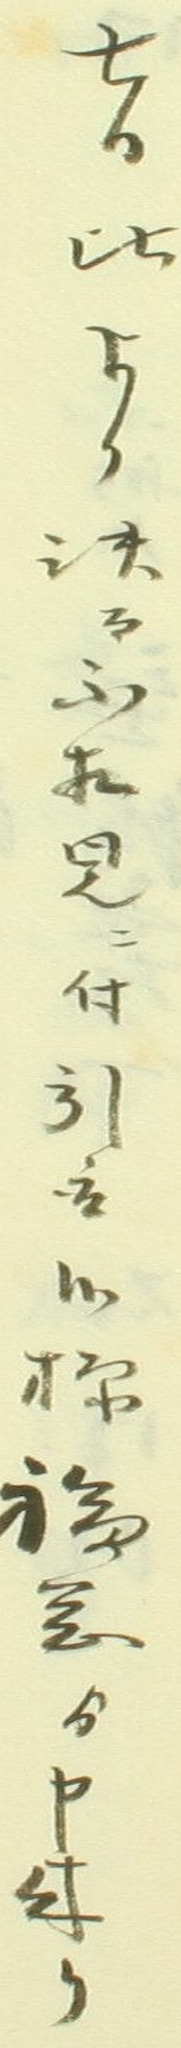七日頃より訣而不相見に付引取候様福岡ゟ申来り
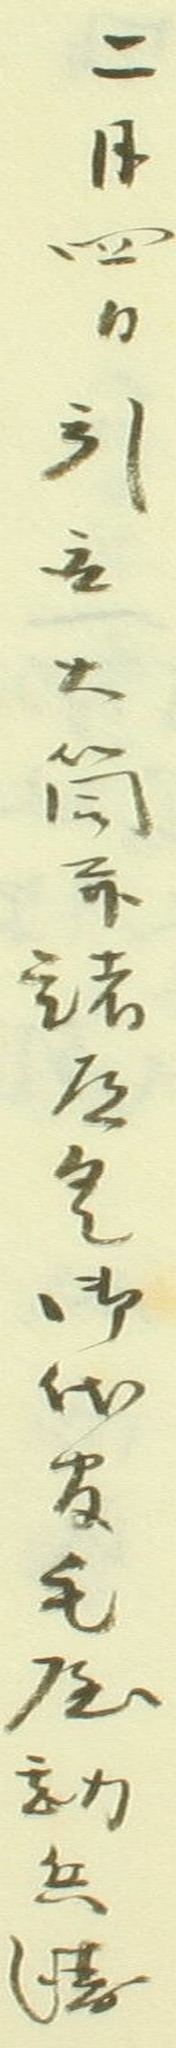二月四日引取大筒並諸道具御代官毛屋勘兵衛
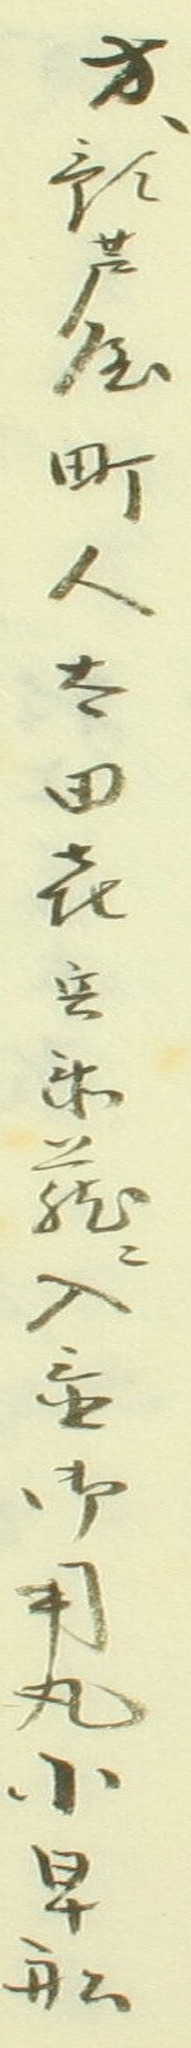方預芦屋町人太田喜兵衛蔵に入置御用丸小早船
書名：唐船漂流記 三
